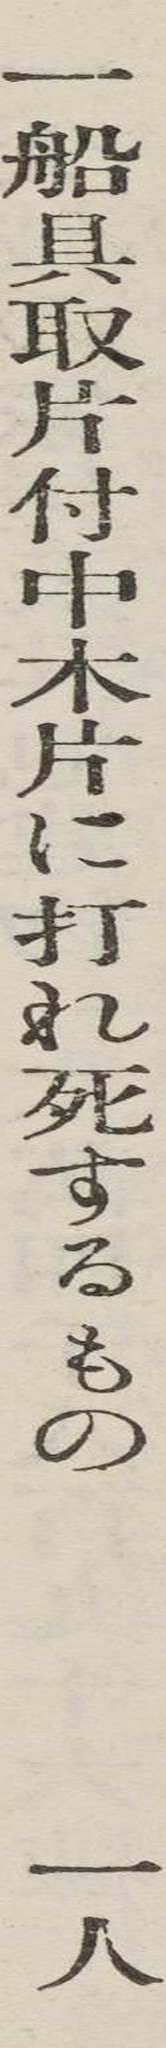一船具取片付中木片に打れ死するもの一人
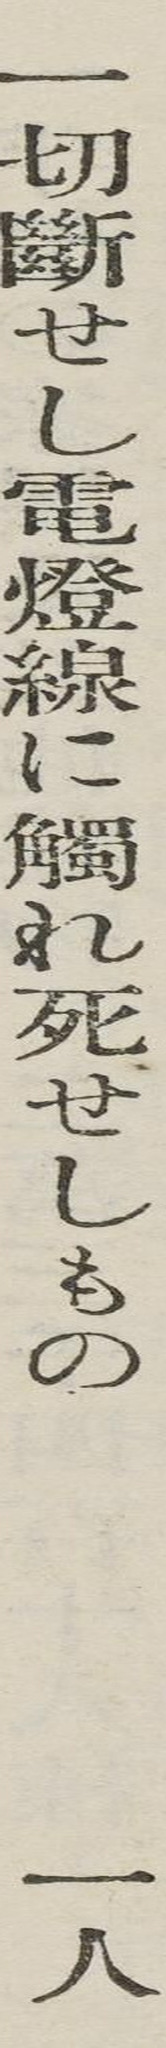一切断せし電燈線に觸れ死せしもの一人
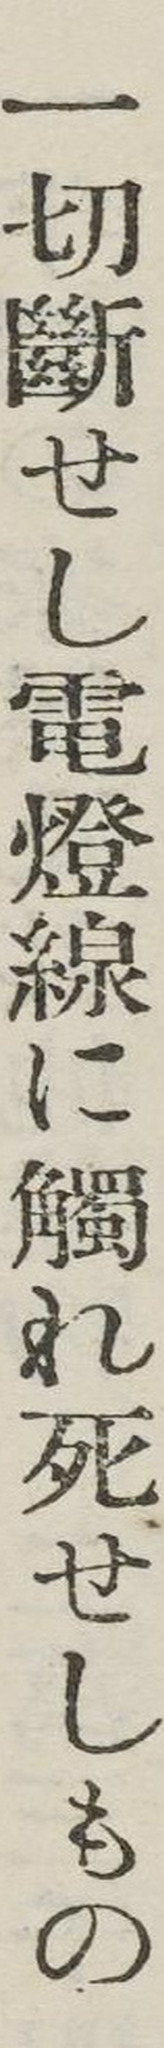一切断せし電燈線に觸れ死せしもの一人
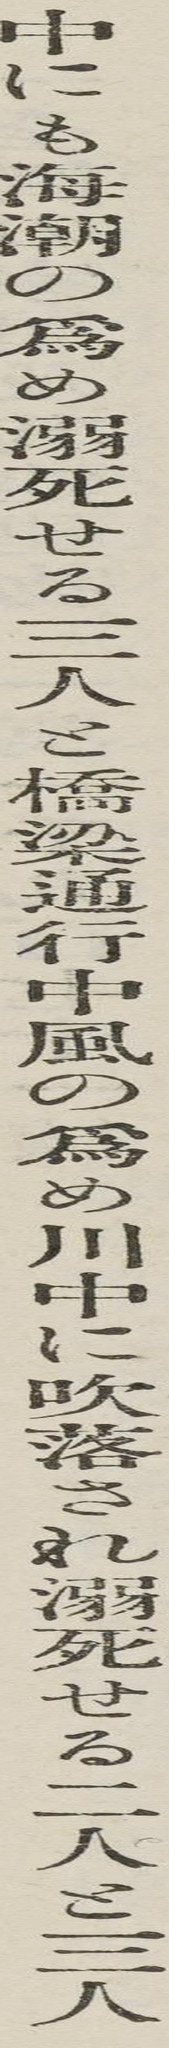中に海潮の為め溺死せる三人と橋梁通行中風の為め川中に吹落され溺死せる二人と三人
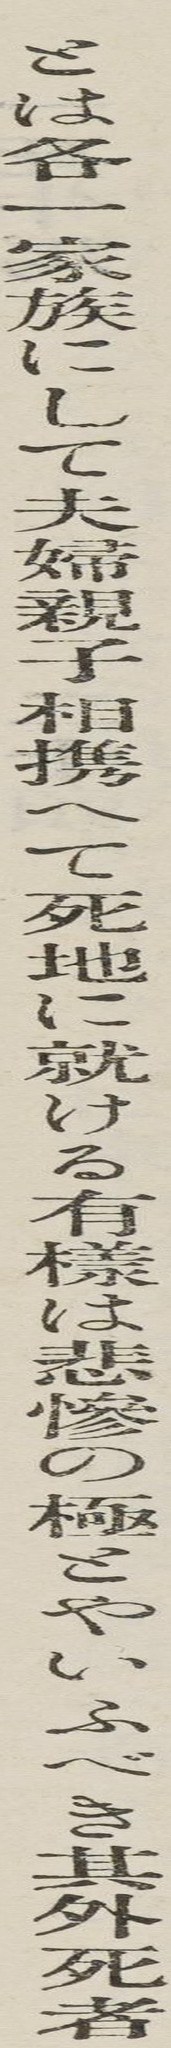とは各一家族にして夫婦親子相携へて死地に就ける有様は悲惨の極とやいふべき其外死者
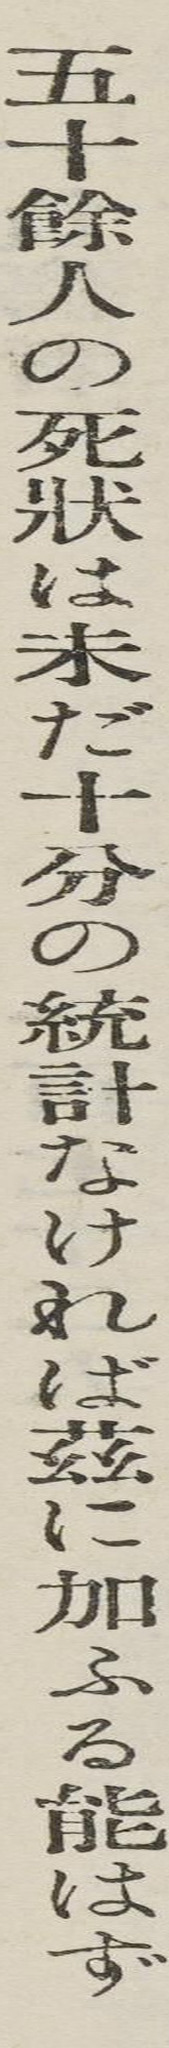五十余人の死状は未だ十分の統計なければ茲に加ふる能はず
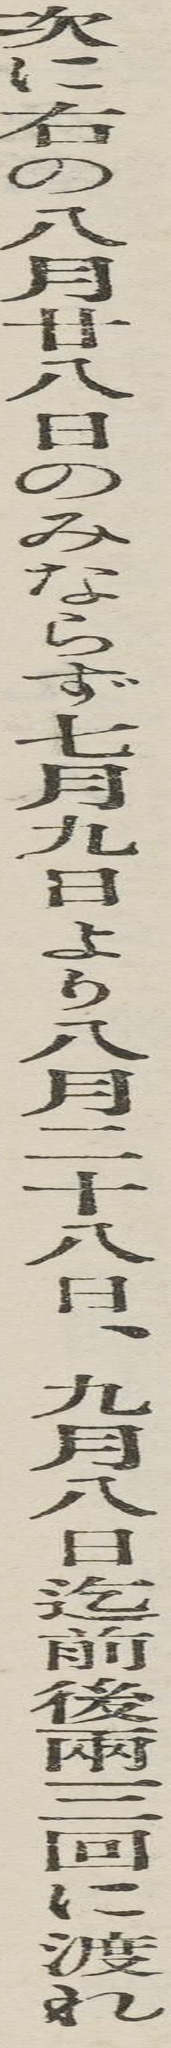次に右の八月廿八日のみならず七月九日より八月二十八日、九月八日迄前後両三回に渡れ
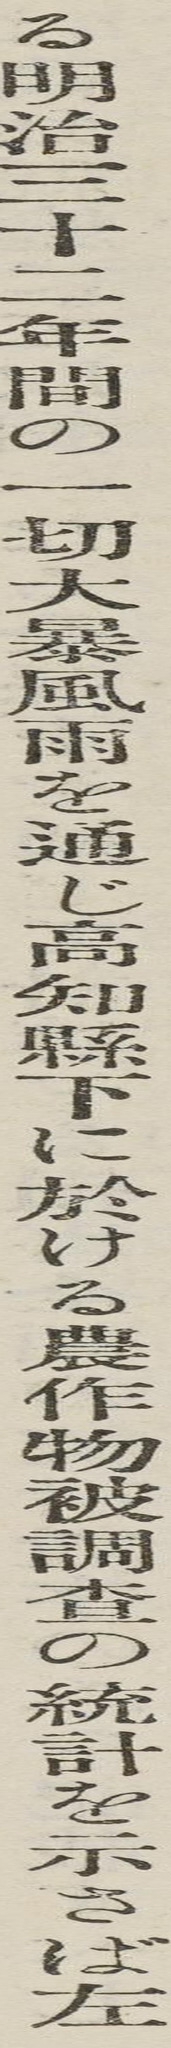る明治三十二年間の一切大暴風雨を通じ高知県下に於ける農作物被調査を示さば左
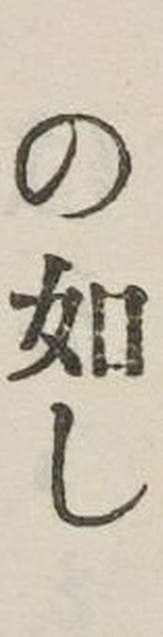の如し
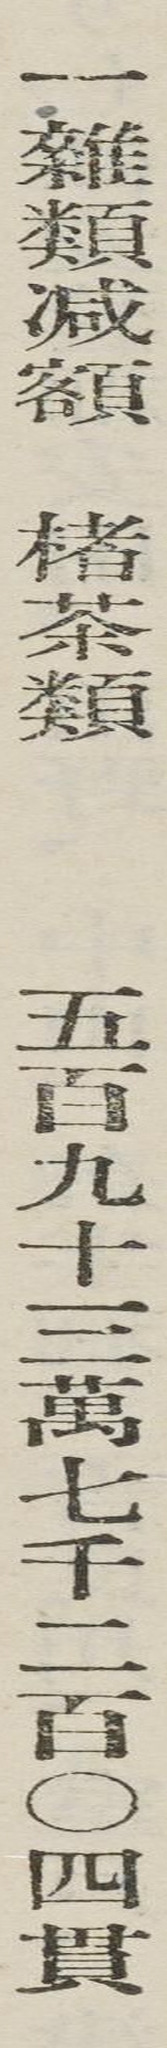一雑類減額楮茶類五百九十三万七千二百〇四貫
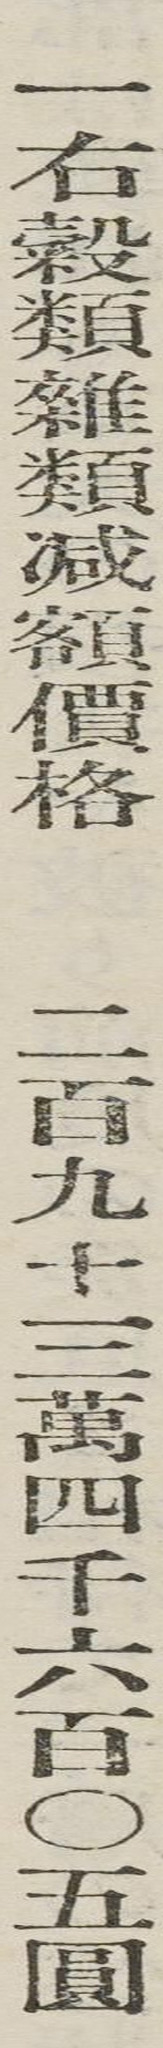一右穀類雑類減額価格二百九十三万四千六百〇五円
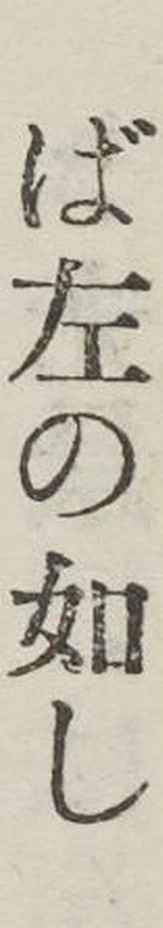ば左の如し
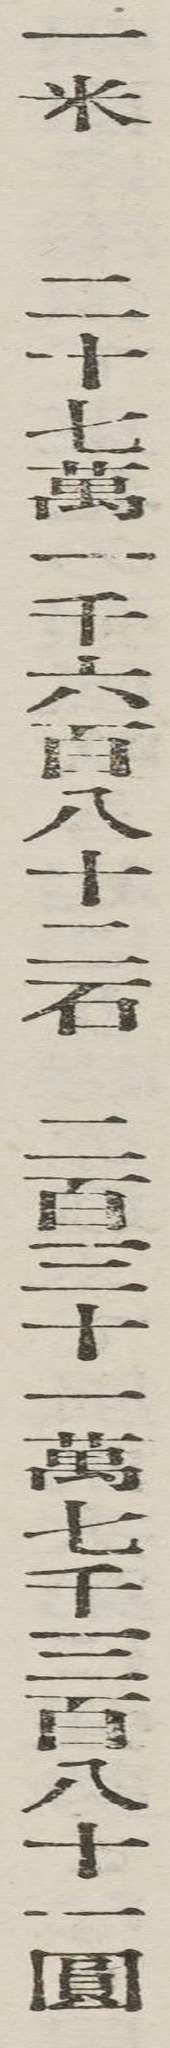一米二十七万一千六百八十二石二百三十一万七千三百八十一円
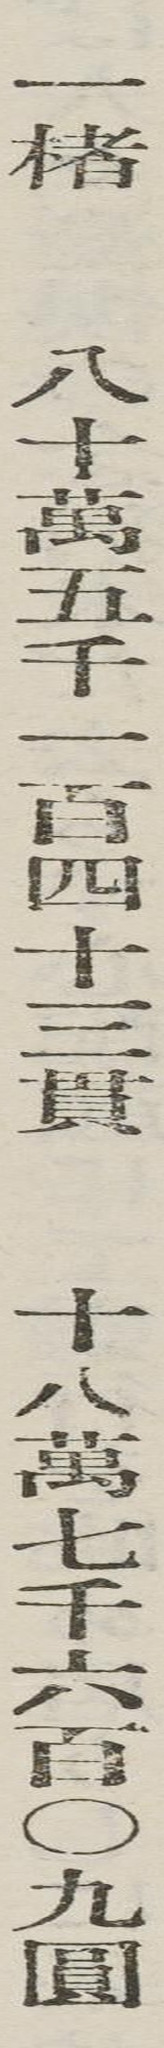一楮八十万五千一百四十三貫十八万七千六百〇九円
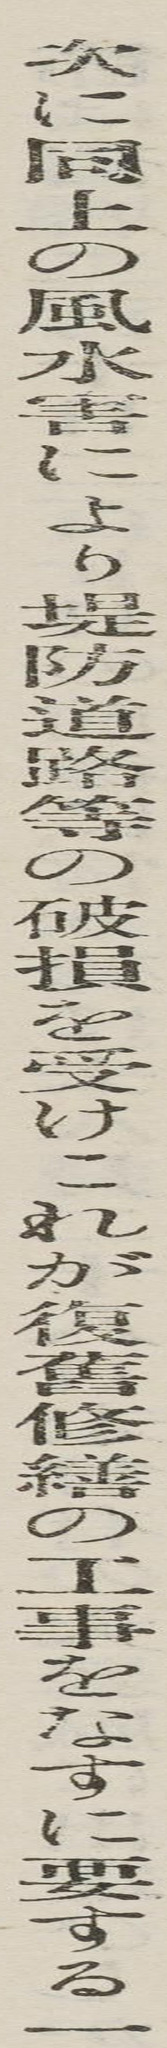次に同上の風水害により堤防道路等の破損を受けこれが復旧修繕の工事をなすに要する一
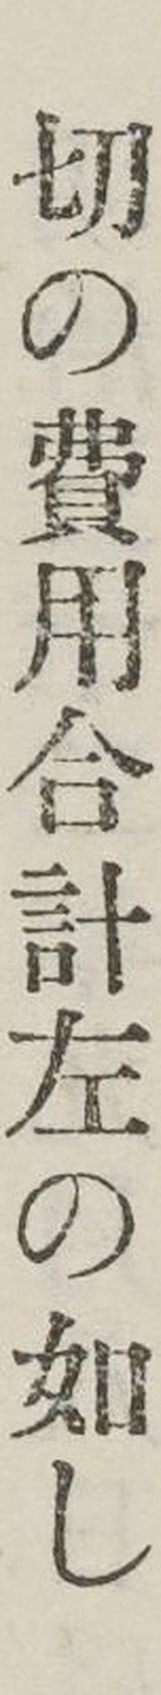切の費用合計左の如し
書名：土佐古今ノ地震
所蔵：東京大学地震研究所図書室 Earthquake Research Institute Library, The University of Tokyo, JAPAN
